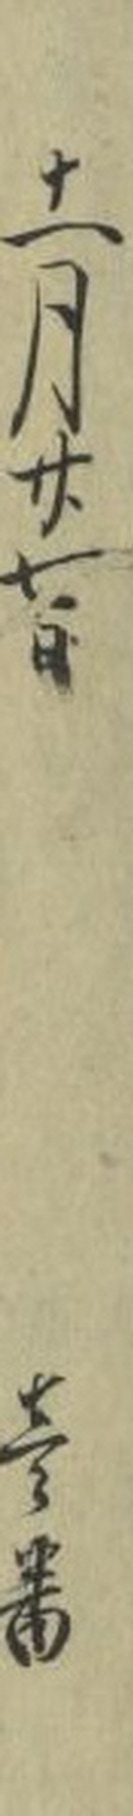十一月廿七日壱番
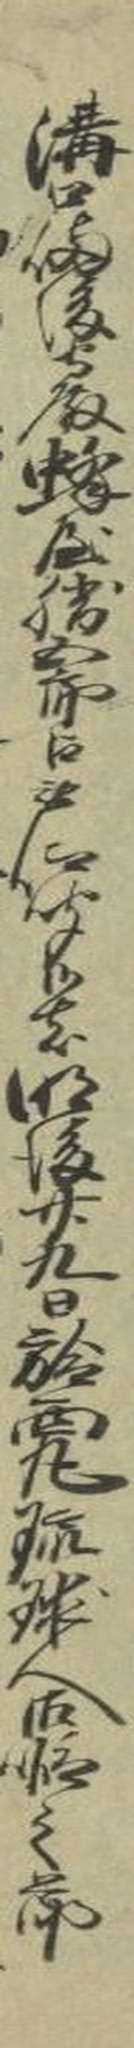一溝口備後守殿蜂屋勝五郎え被仰聞候は明後廿九日於西丸琉球人御暇之節
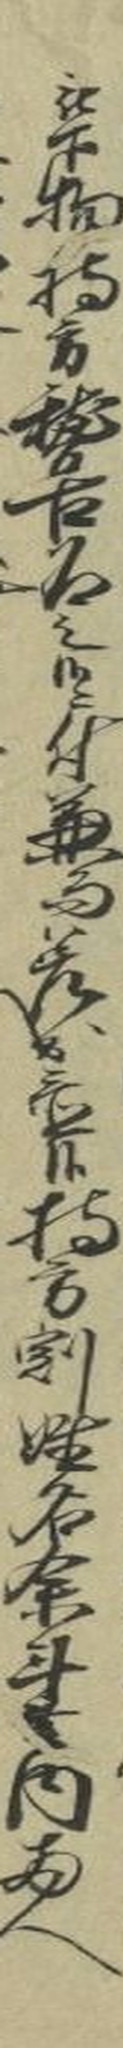被下物持方稽古有之候に付兼て差出置候持方割姓名余計之内両人
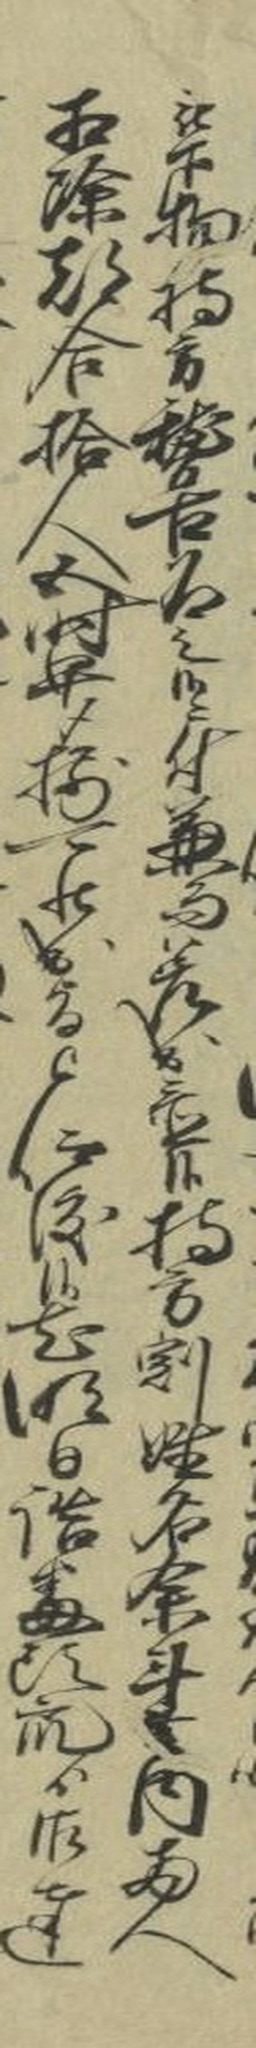相除都合拾人五時早め揃可罷出旨被仰渡候尤明日詰番頭衆ゟ御達
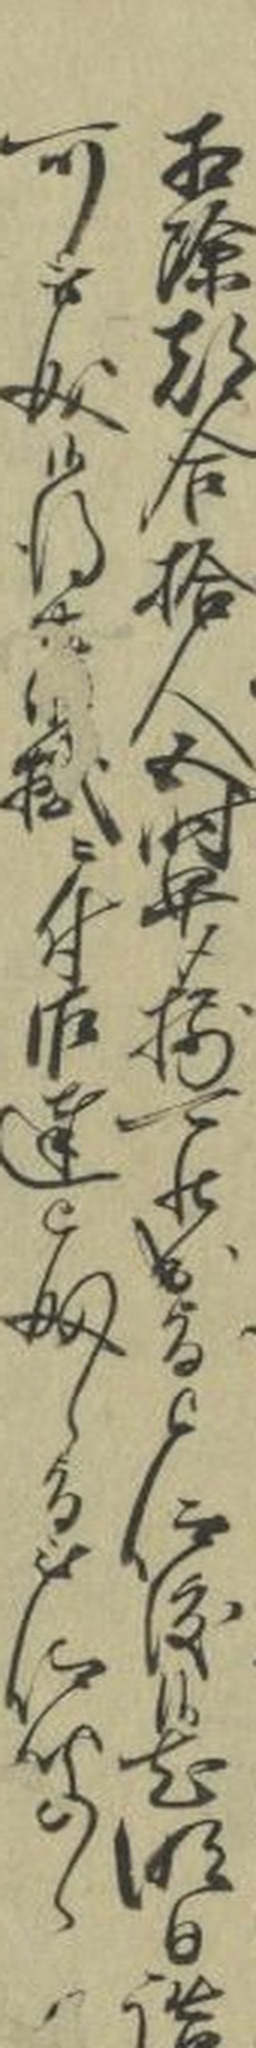可被成候得は御掛に付御達被成候旨被仰聞候
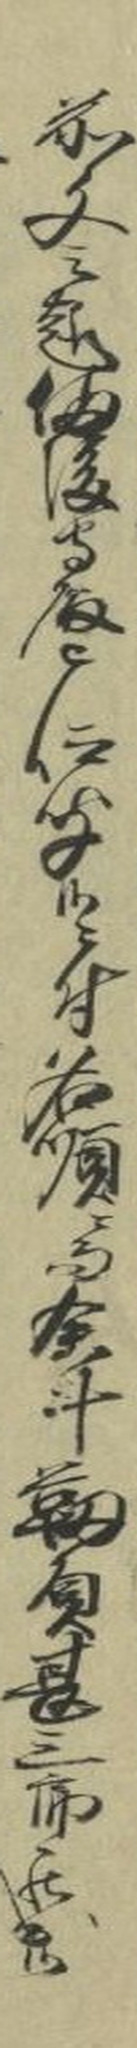一前文之趣備後守殿被仰聞候に付各順にて余計靱負甚三郎罷出候
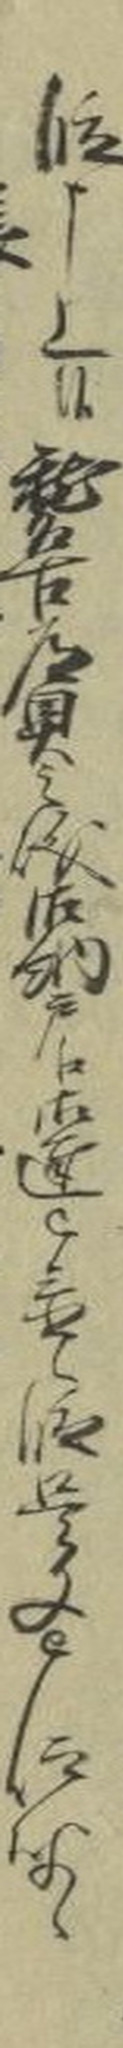段申上候稽古道具之儀御納戸え御達被置候段是又被仰聞候
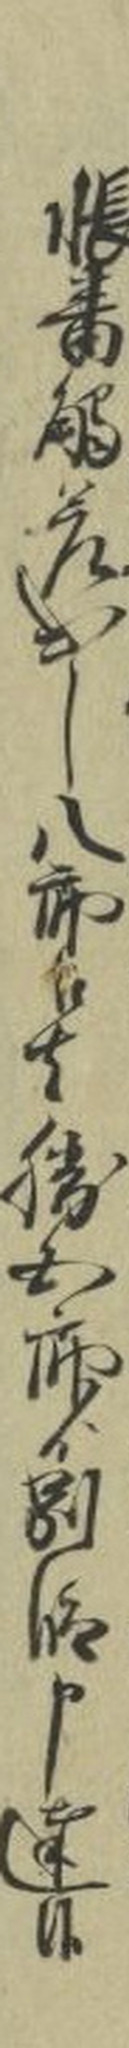帳番触差出し八郎えは勝五郎ゟ別段申達候
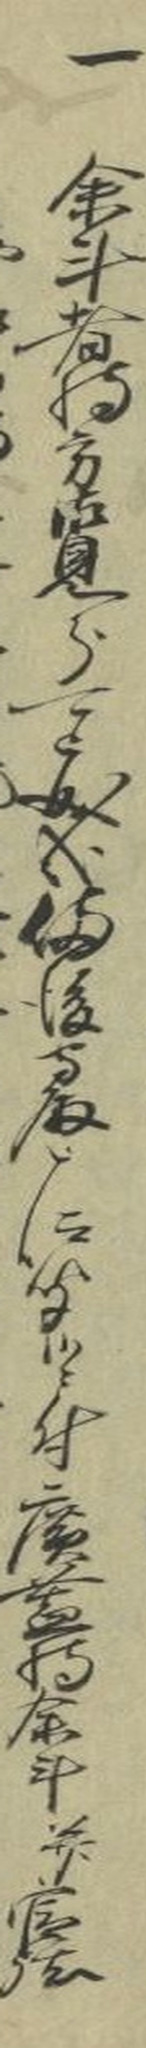一余計者持方御見分可被成哉備後守殿被仰聞候に付広蓋持并官絃
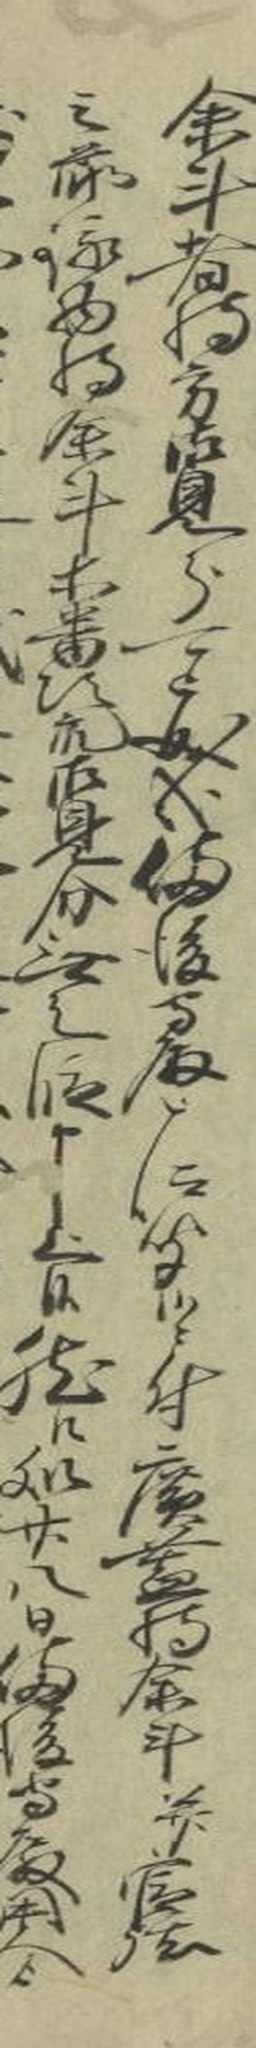之節録物持余計等番頭衆御見分無之段申上候然る処廿八日備後守殿用人ゟ
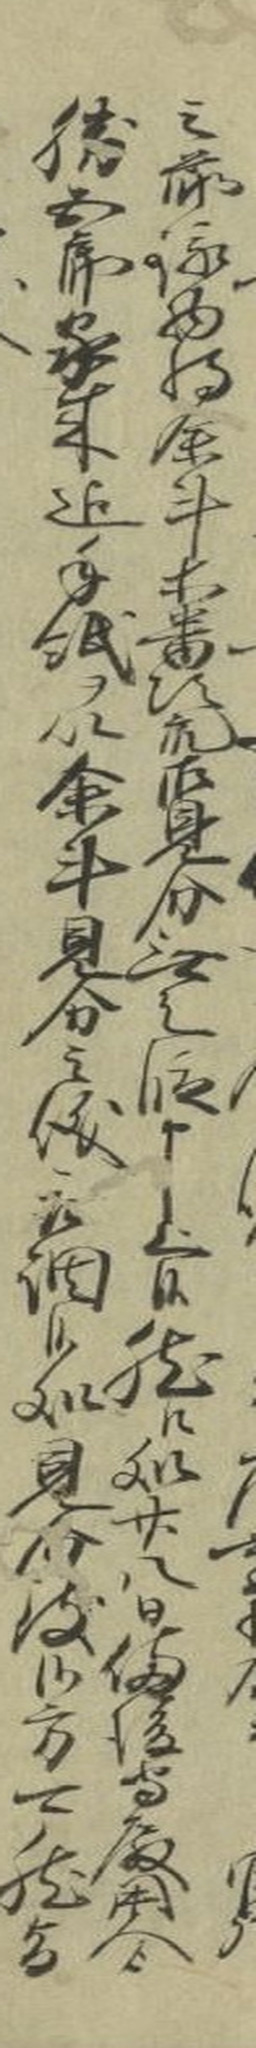勝五郎家来迄手紙を以余計見分之儀取調候処見分致候方可然旨
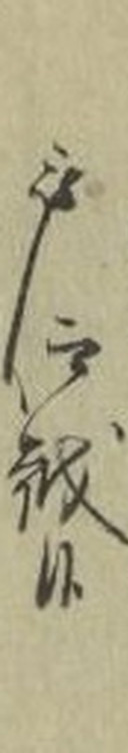被仰越候
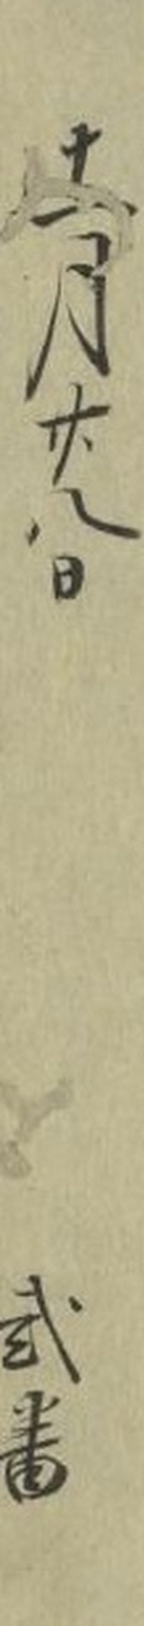十一月廿八日弐番
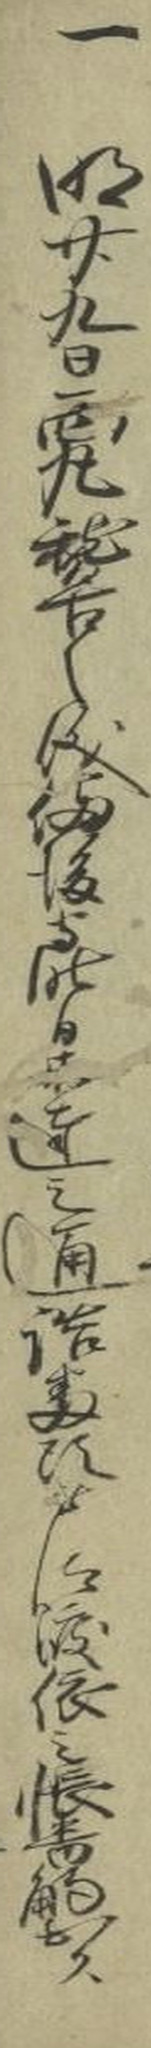一明廿九日西丸稽古之儀備後守昨日来達之通詰番頭被仰渡依之帳番触出候

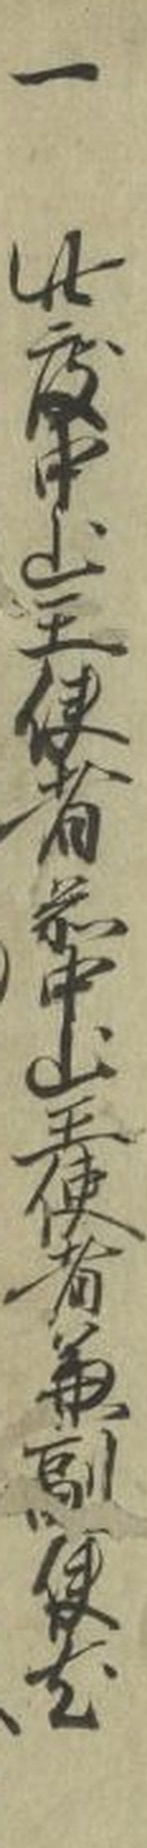一此段中山王使者前中山王使者兼副使尤
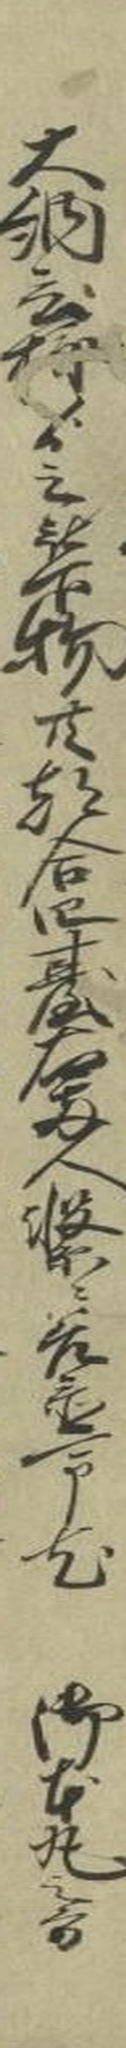大納言様ゟ之被下物共都合四台右両人繋に差置可申尤御本丸之方
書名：天保三壬辰年琉球人参府之節勤方書留
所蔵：University of the Ryukyus Library
